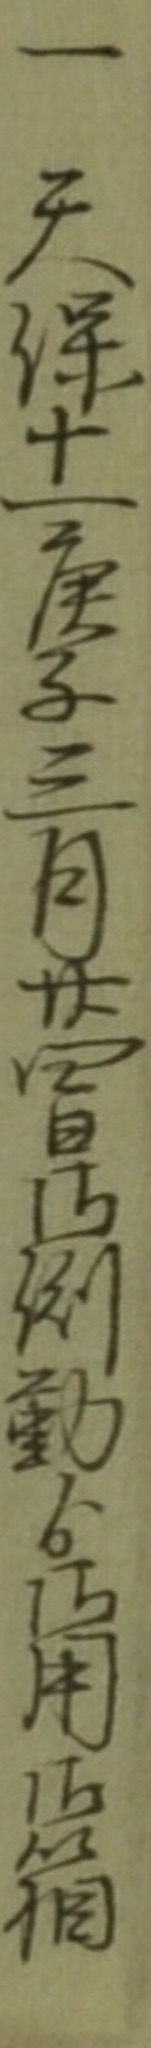一天保十一庚子三月廿四日御側勤より御用御箱
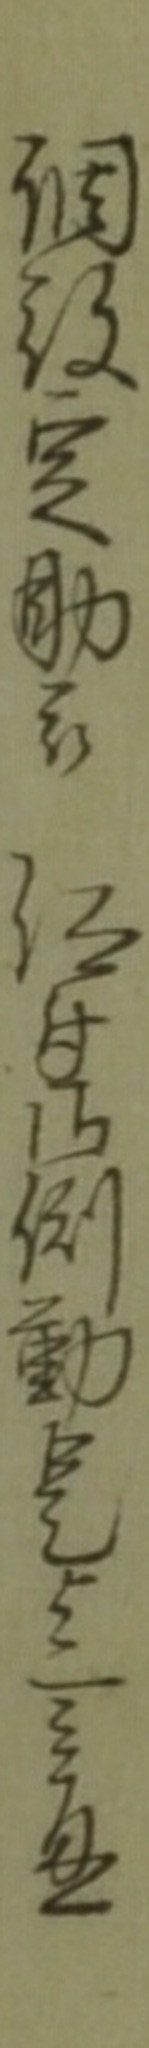調役定助被仰付御側勤是迄之通
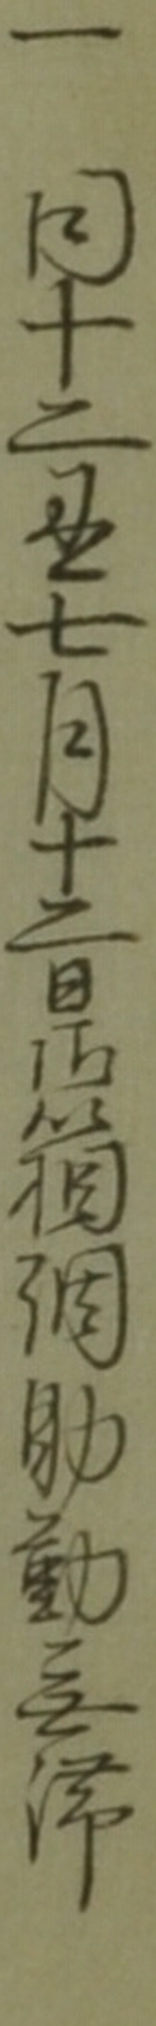一同十ニ丑七月十二日御箱調助勤無滞

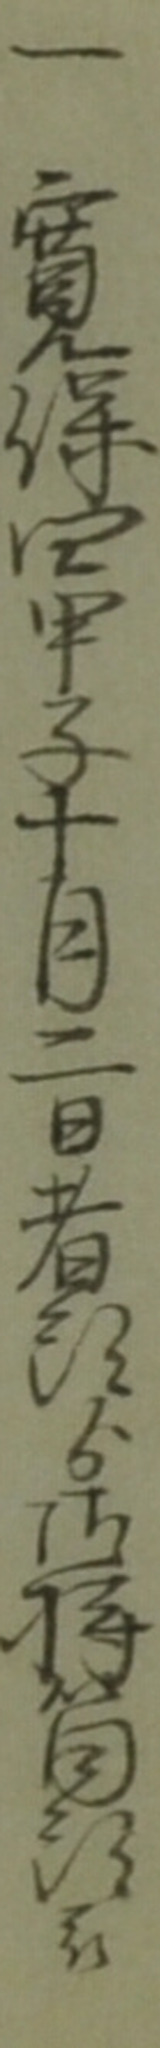一寛保四甲子十月二日者頭ゟ御持筒頭被
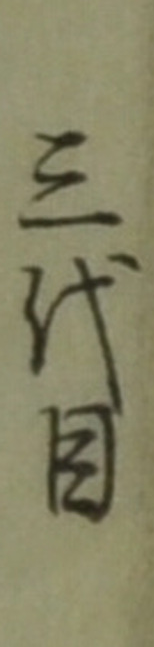三代目
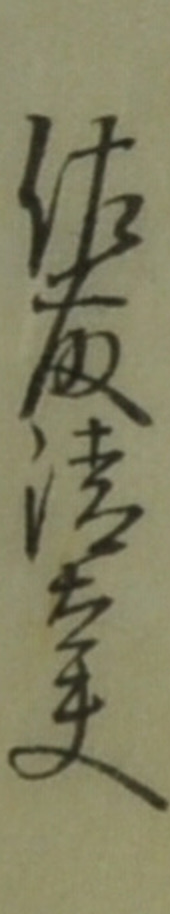佐藤清太夫
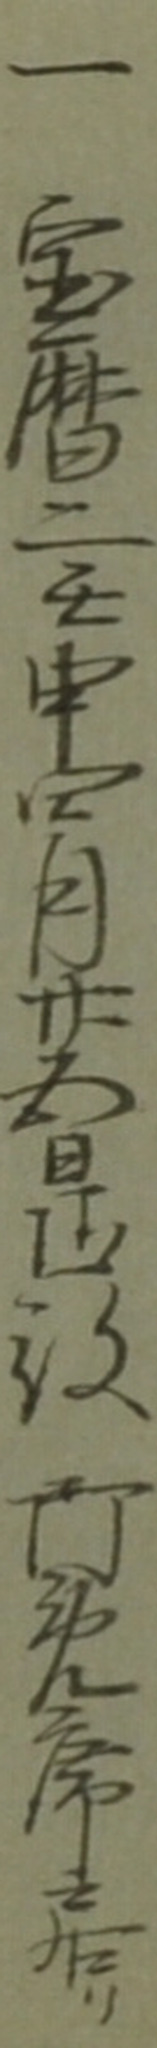一宝暦二壬申四月廿五日御役御免席居
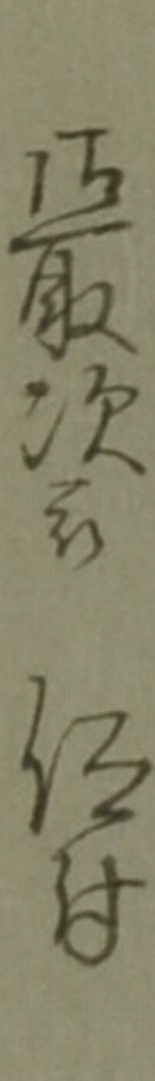御取次被仰付
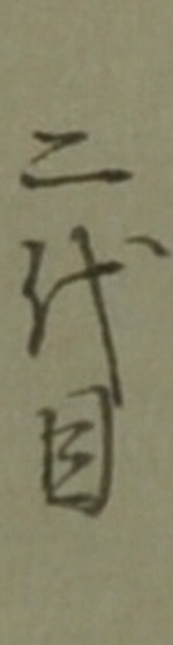二代目
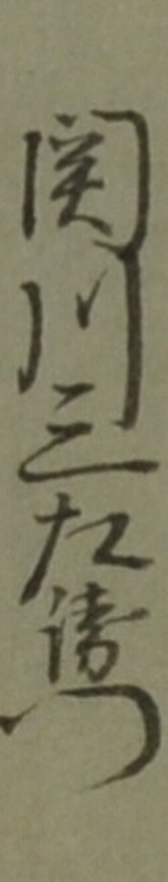関川三左衛門
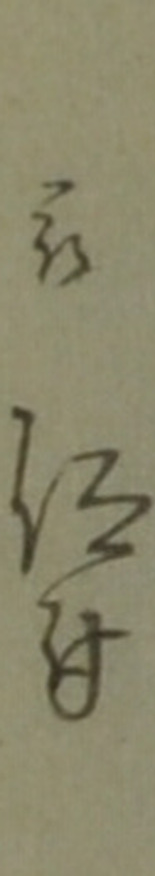被仰付
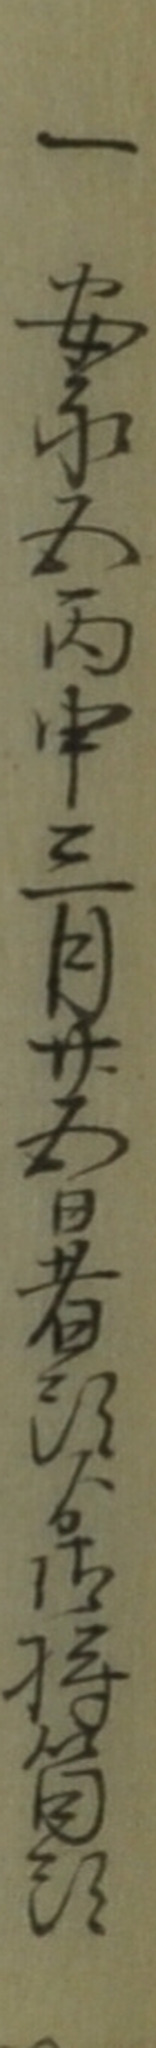一安永五丙申三月廿五日者頭ゟ御持筒頭
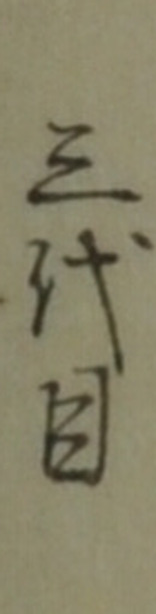三代目
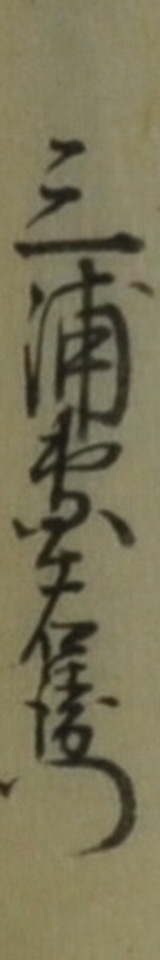三浦團右衛門
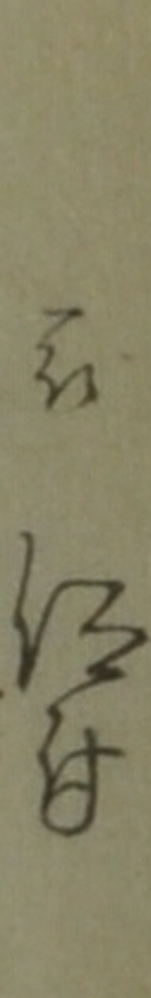被仰付
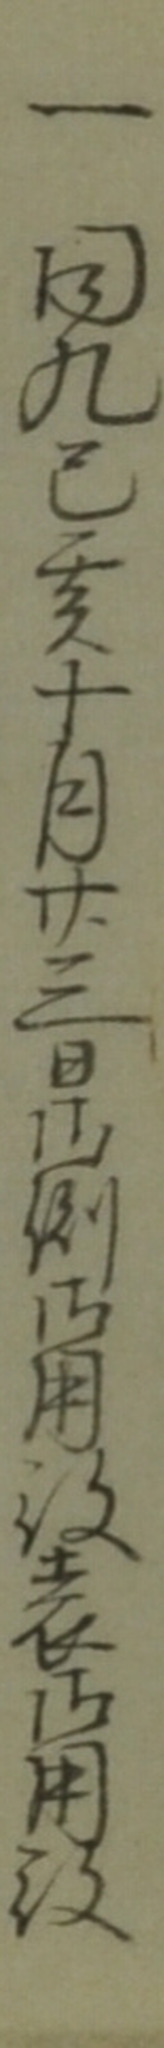一同九己亥十月廿三日御側御用役表御用役
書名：諸御役代々録（二）
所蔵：伊那市立高遠町図書館・合同会社AMANE
